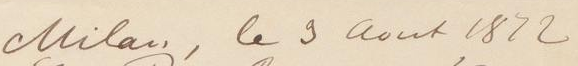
Milan, le 3 Aout 1872
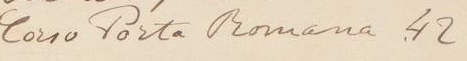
Corso Porta Romana. 42
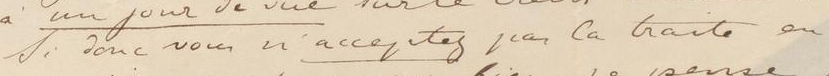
Si donc vous n'acceptez pas la traite en
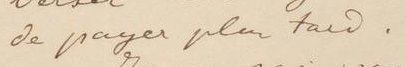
de payer plus tard.
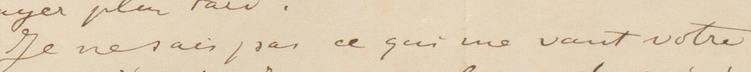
Je ne sais pas ce qui me vaut votre
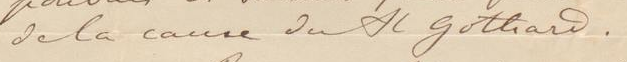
de la cause du St Gothard.
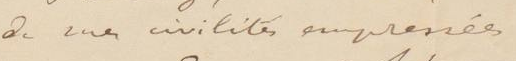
de mes civilités empressées
